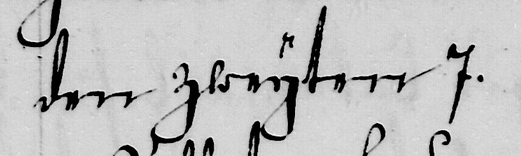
den zweyten 7.
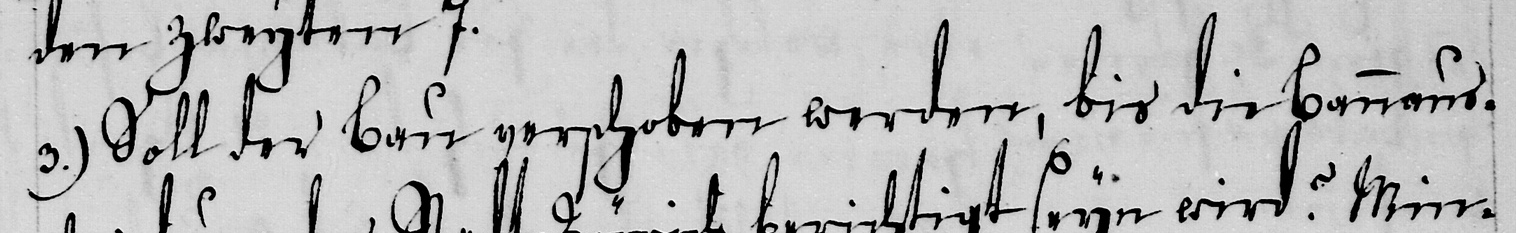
3.) Soll der Bau verschoben werden, bis die Bannaus¬
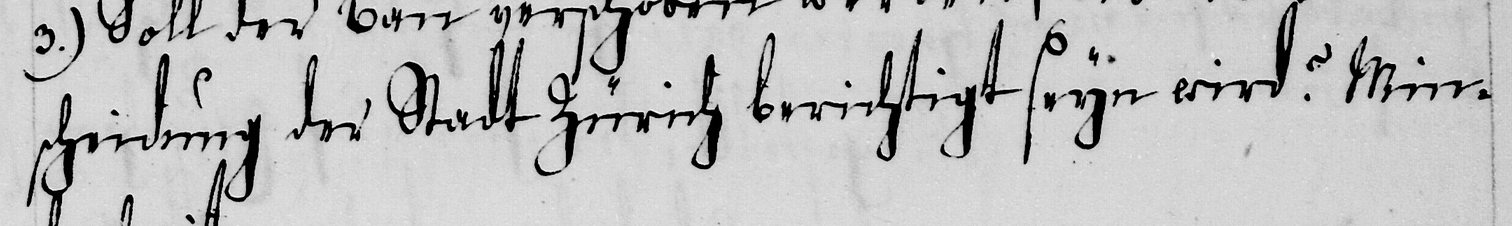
scheidung der Stadt Zürich berichtigt seyn wird? Min¬
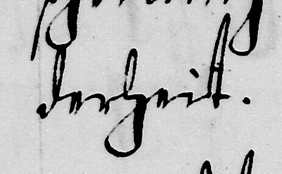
derheit.
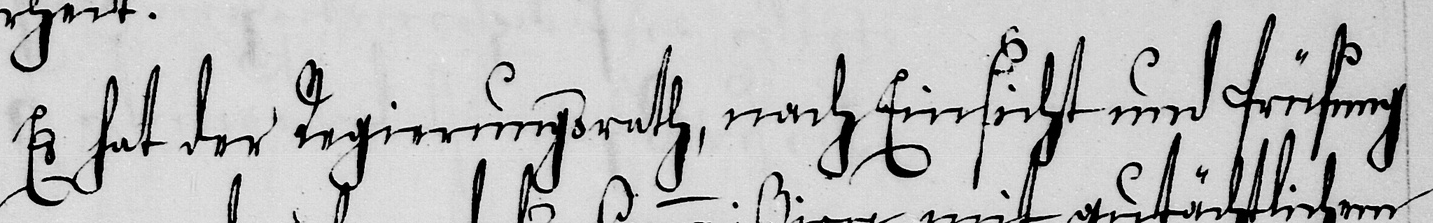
hat der Regierungsrath, nach Einsicht und Prüfung
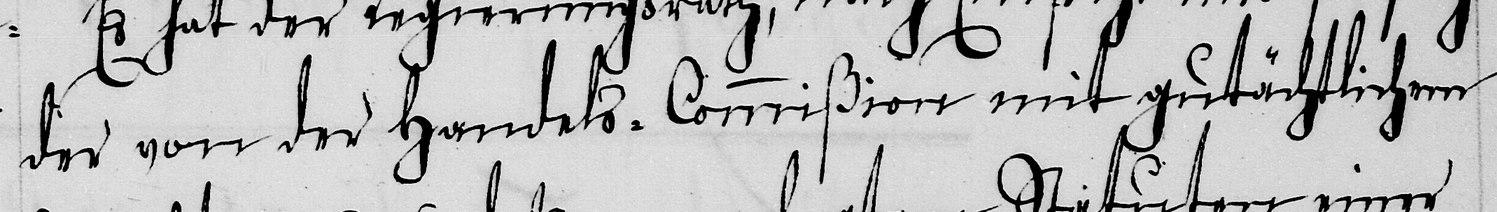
der von der Handels-Commißion mit gutächtlichem
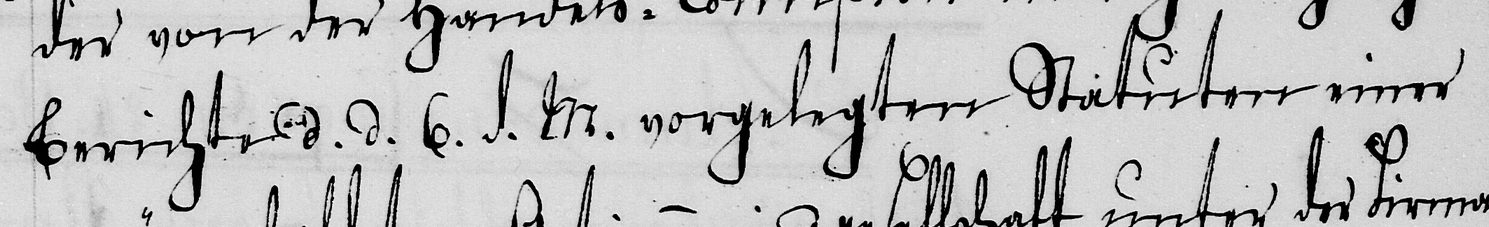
Berichte d. d. 6. d. M. vorgelegten Statuten einer
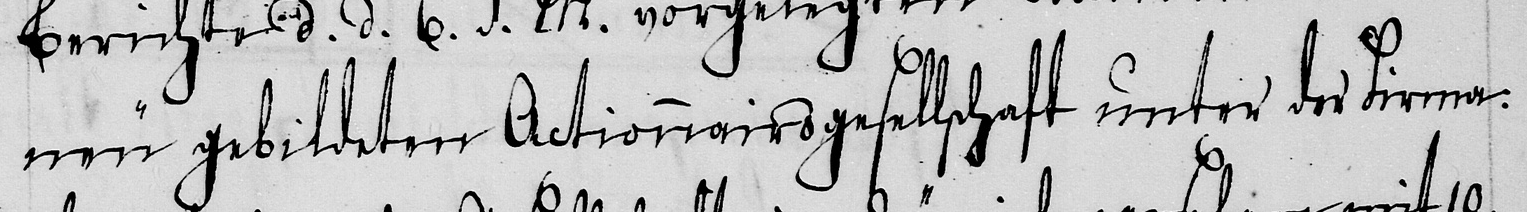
neu gebildeten Actionnairgesellschaft unter der Firma:
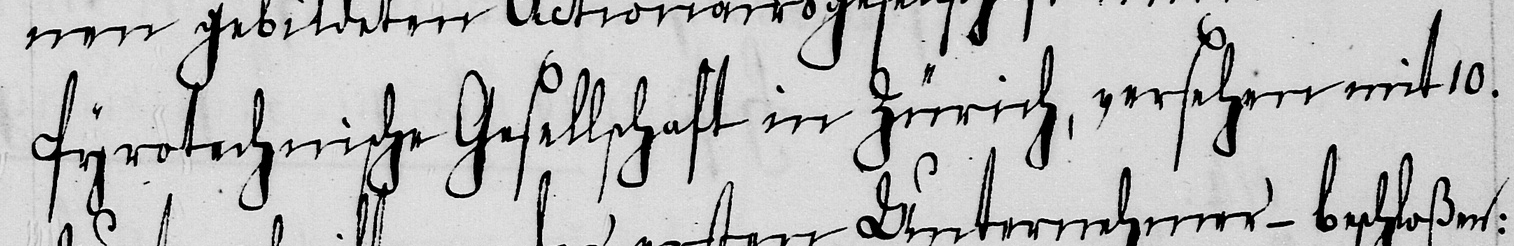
Pyrotechnische Gesellschaft in Zürich, versehen mit 10.
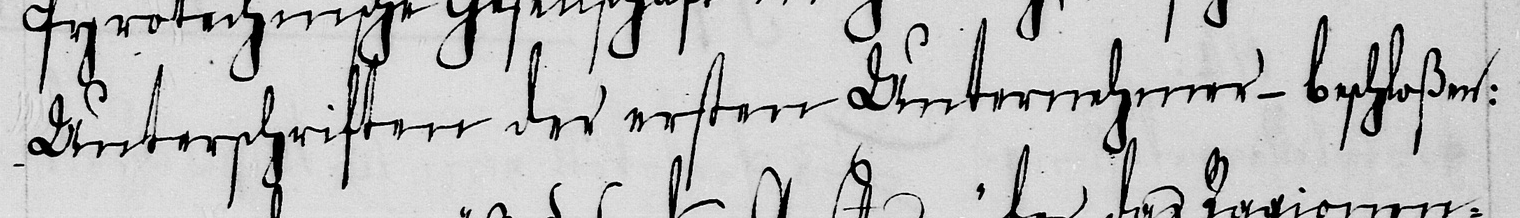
Unterschriften der ersten Unternehmer – beschloßen:
